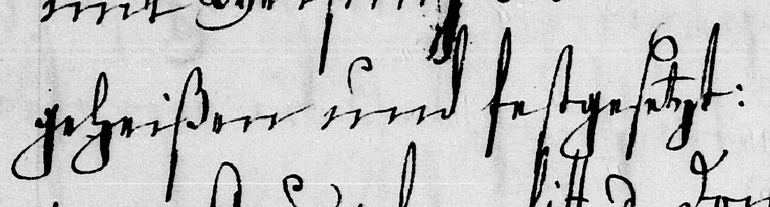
geheißen und festgesetzt:
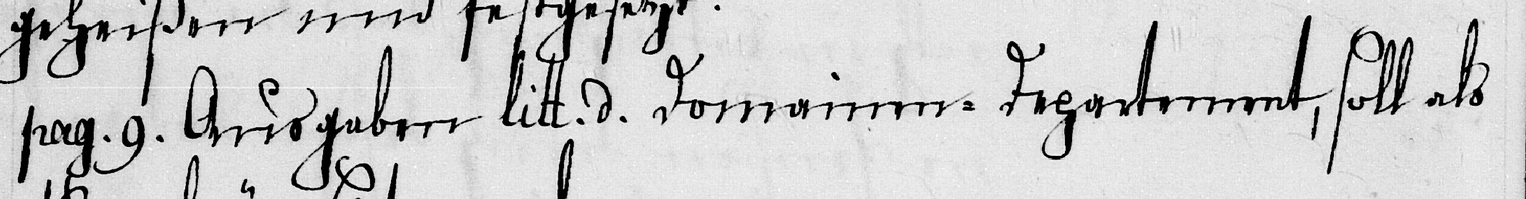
pag. 9. Ausgaben litt. d. Domainen-Departement, soll als
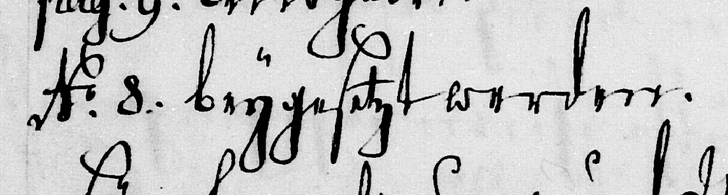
No. 8. beygesetzt werden.
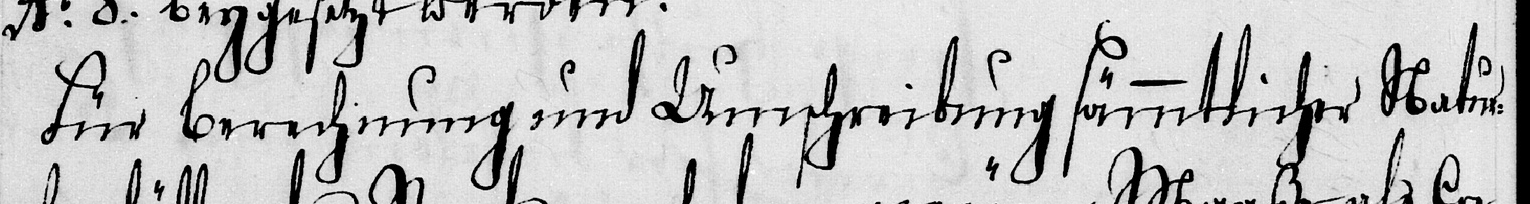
Für Berechnung und Umschreibung sämmtlicher Natur¬
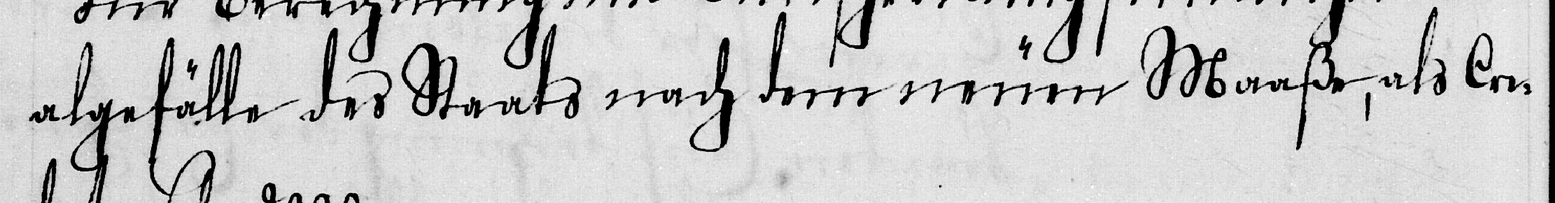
algefälle des Staats nach dem neuen Maaße, als Cre¬
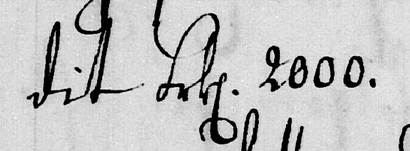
dit Frk[en]. 2000.
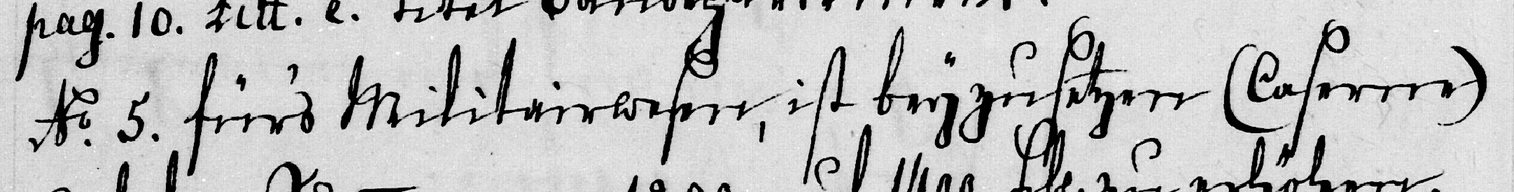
No. 5. fürs Militairwesen, ist beyzusetzen (Caserne)
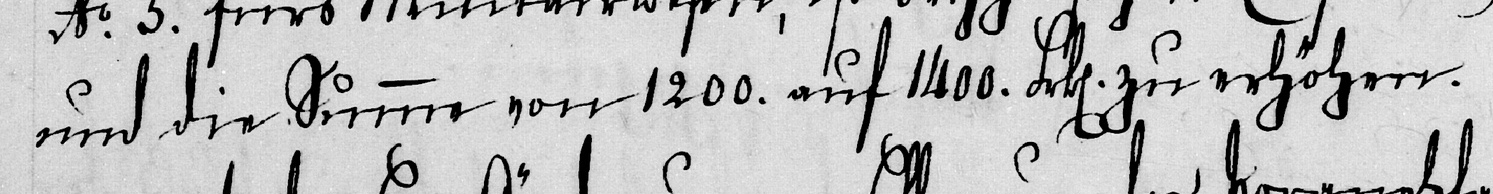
und die Summe von 1200. auf 1400 Frk[en]. zu erhöhen.
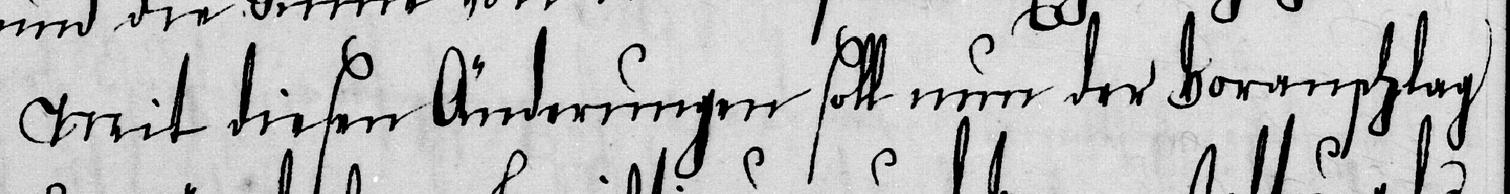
Mit diesen Änderungen soll nun der Voranschlag
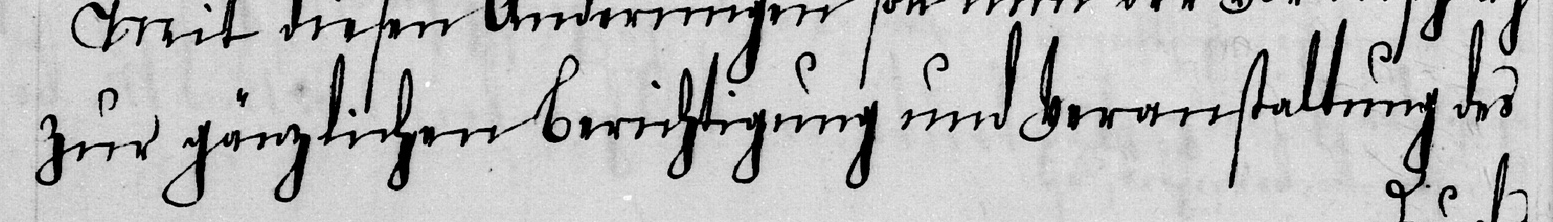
zur gänzlichen Berichtigung und Veranstaltung des
